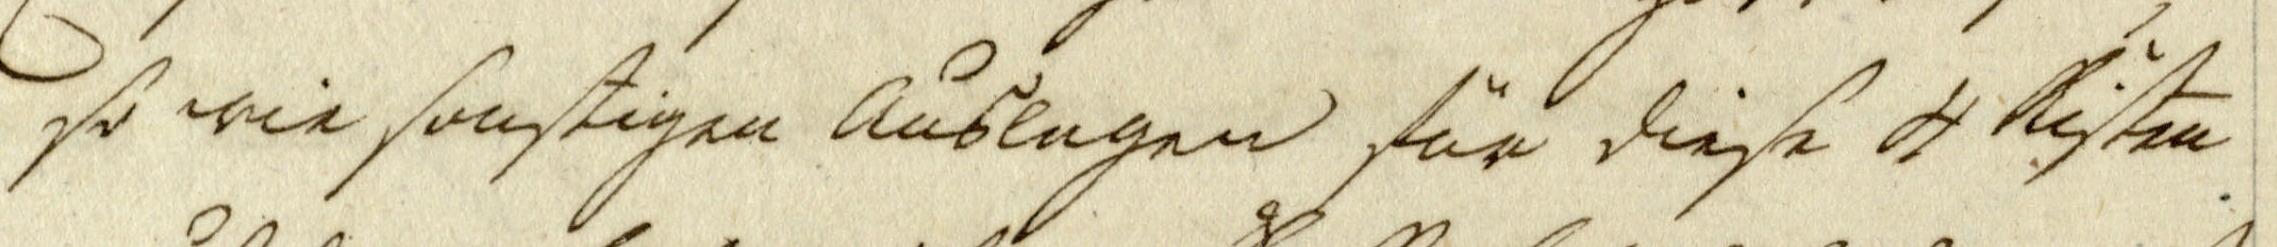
so wie sonstigen Auslagen für diese 4 Kisten
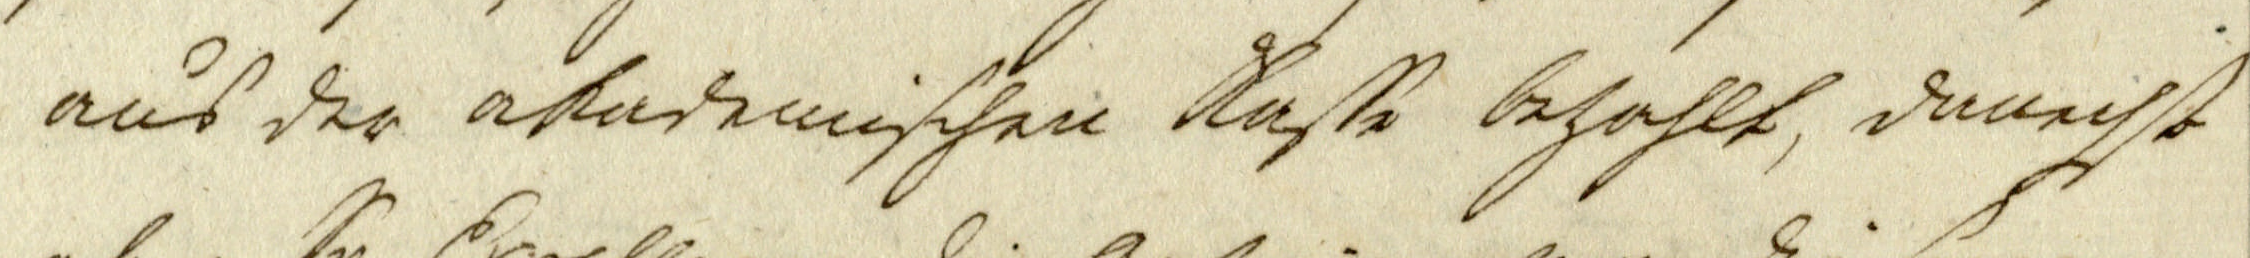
aus der akademischen Kasse bezahlt, danechst
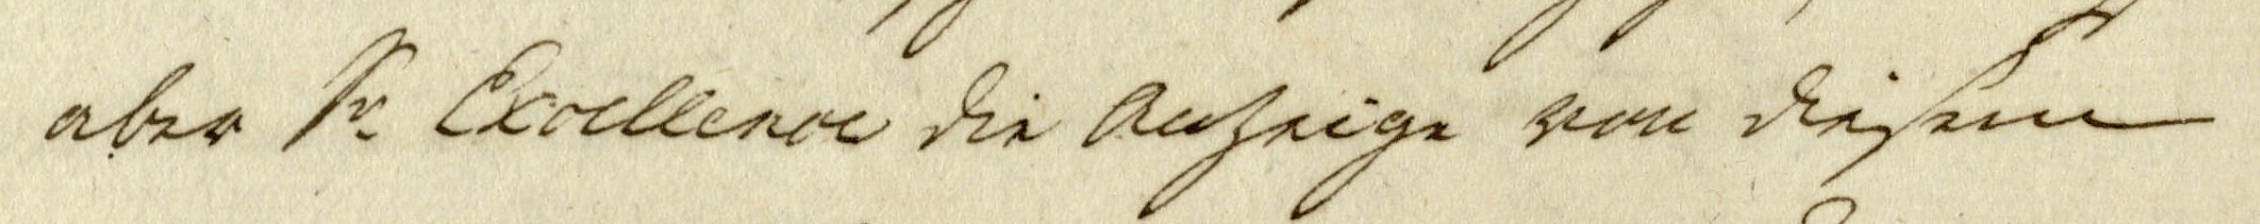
aber Sr. Excellence die Anzeige von diesem
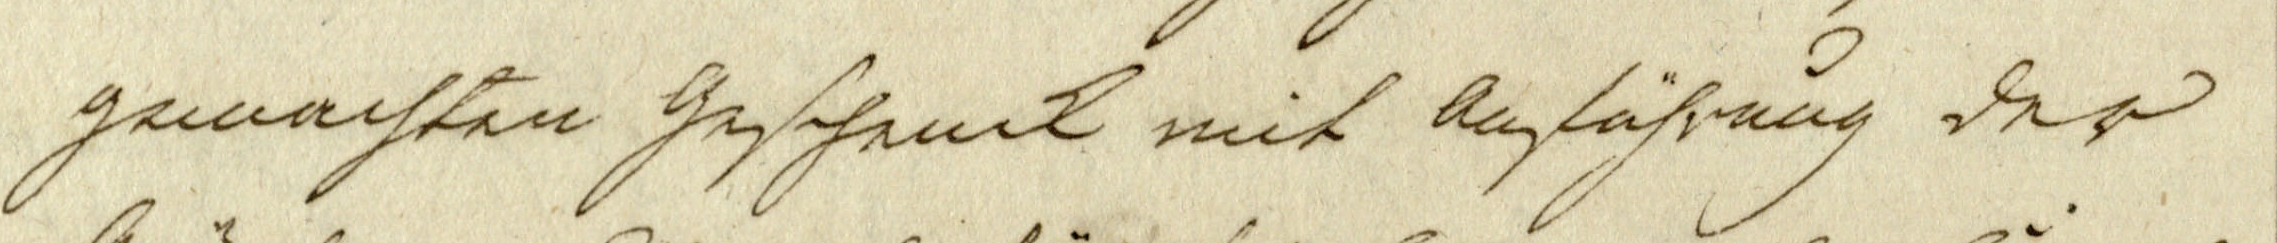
gemachten Geschenck mit Anführung der
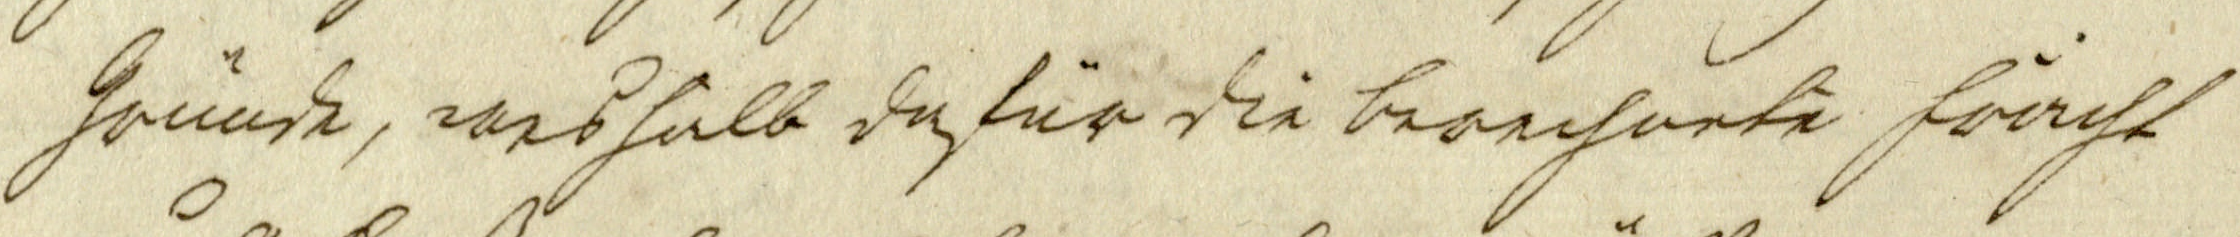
Gründe, weshalb dafür die berechnete Fracht
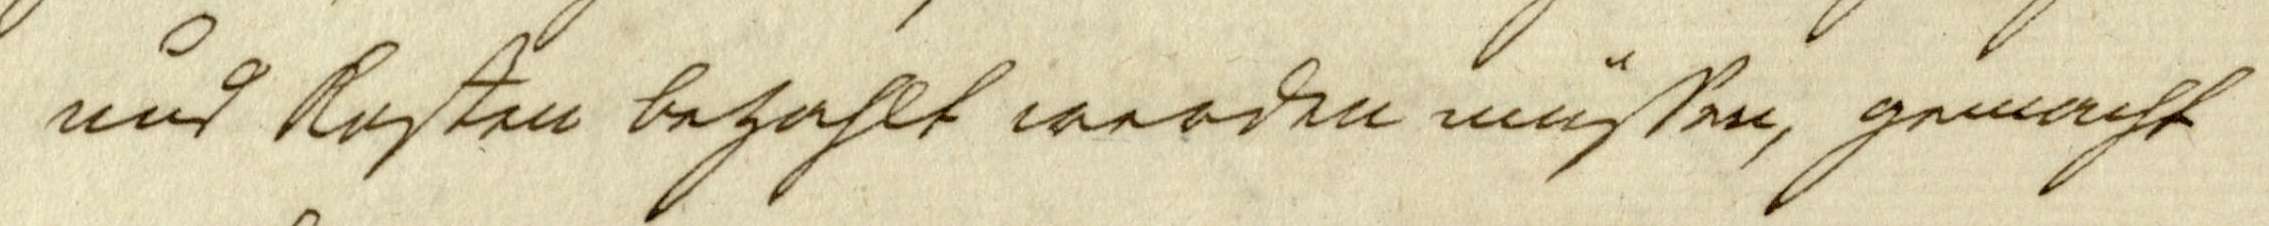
und Kosten bezahlt werden müssen, gemacht
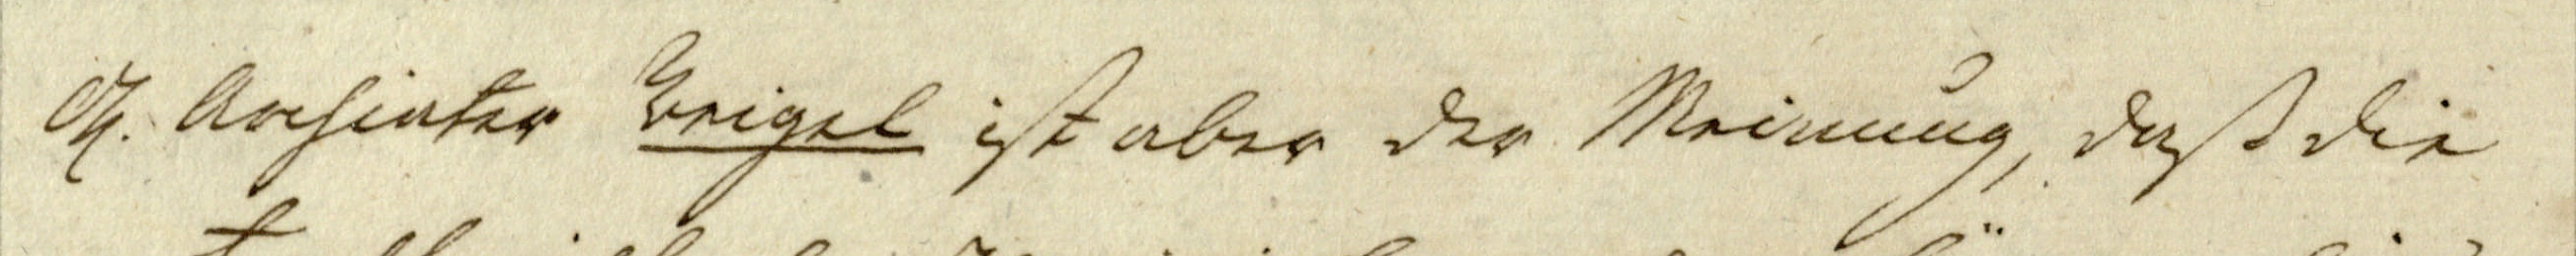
dh. Archiater Weigel ist aber der Meinung, daß die
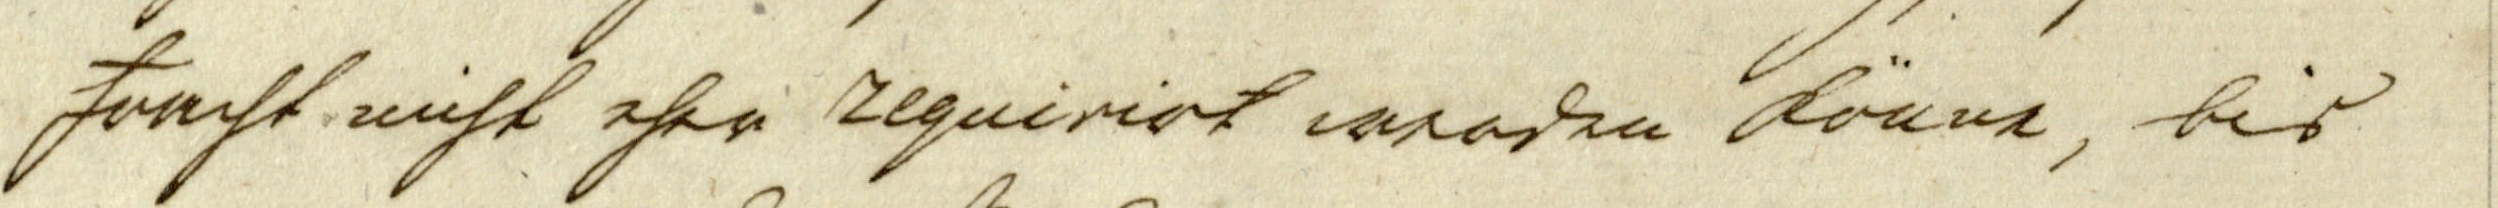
Fracht nicht eher requirirt werden könne, bis
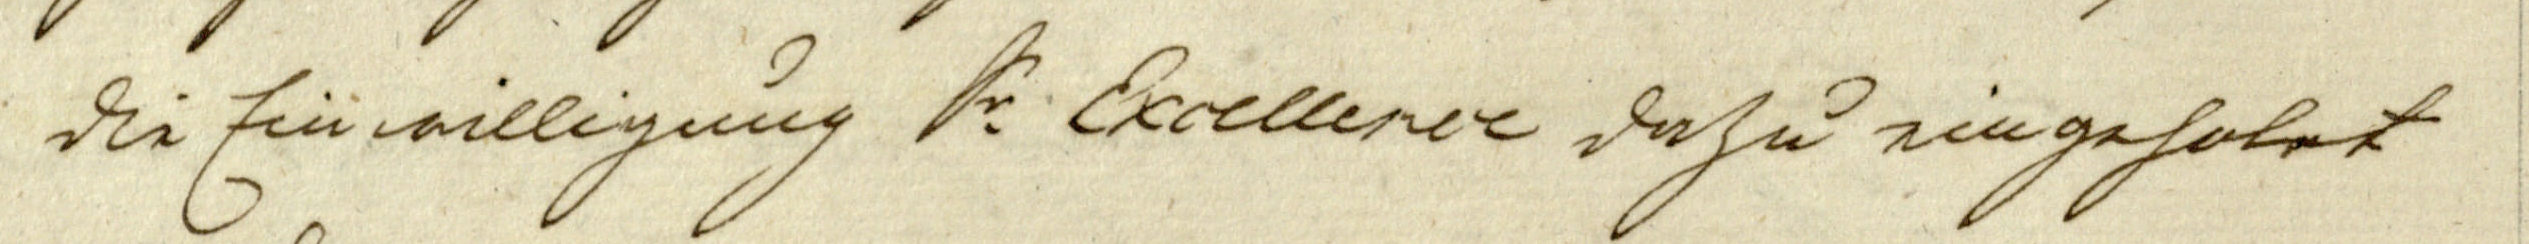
die Einwilligung Sr. Excellence dazu eingeholet
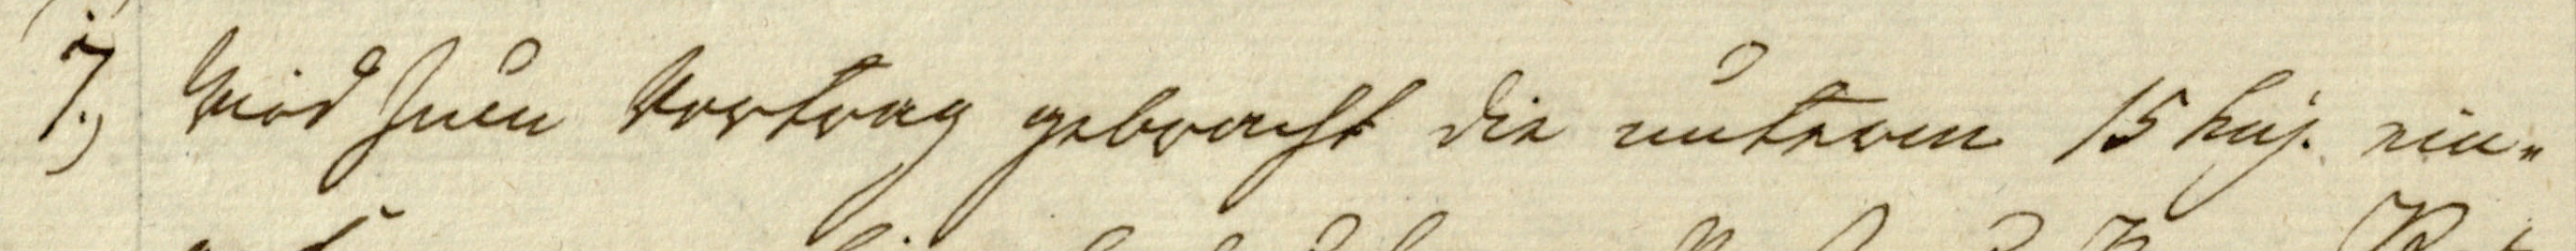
7., Wird zum Vortrag gebracht die unterm 15. huj. ein¬
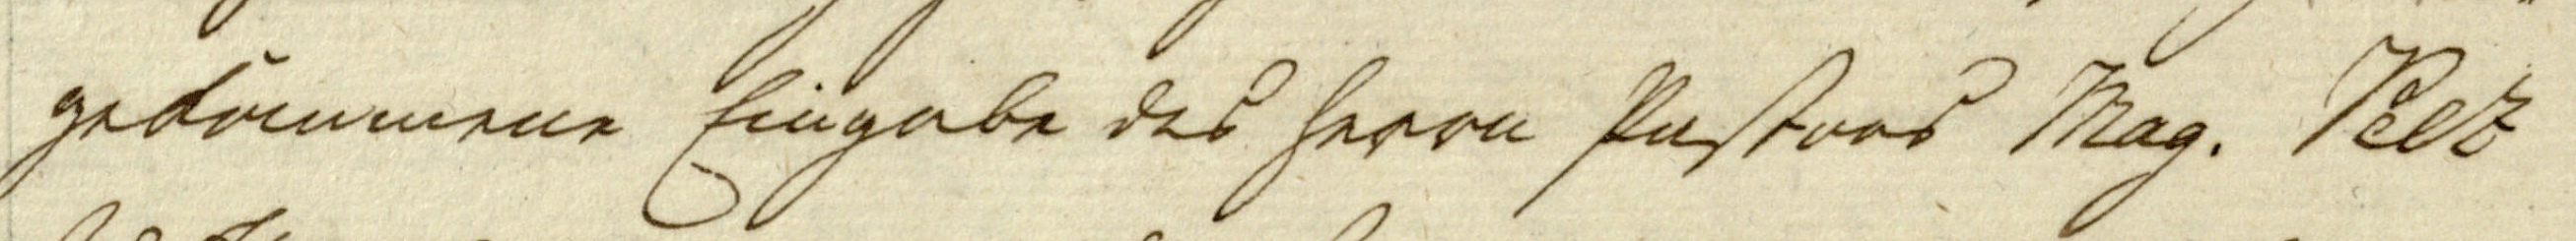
gekommene Eingabe des herrn Pastors Mag. Pelz
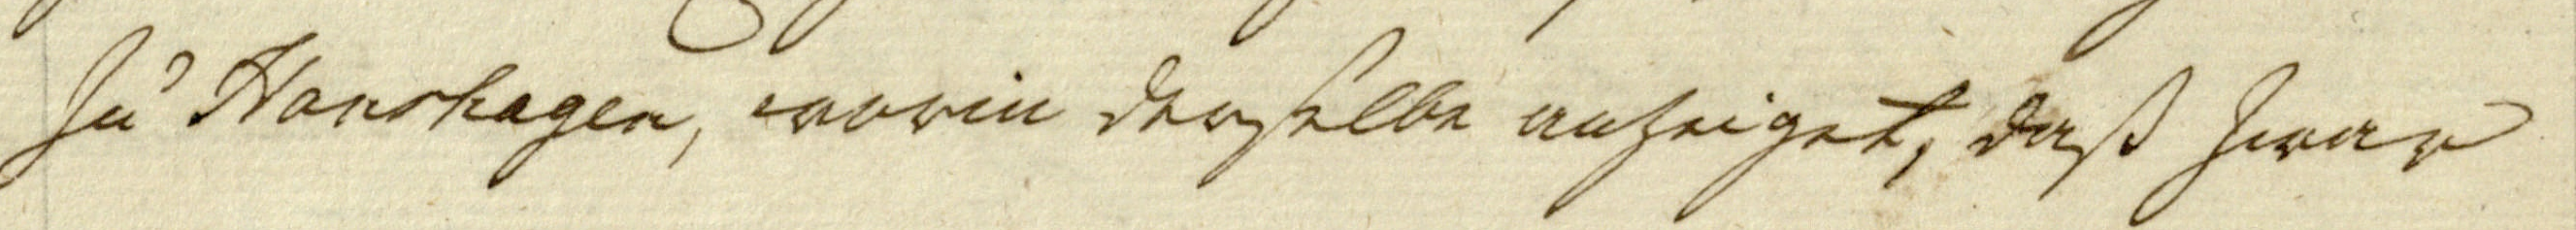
zu Hanshagen, worin derselbe anzeiget, daß zwar
